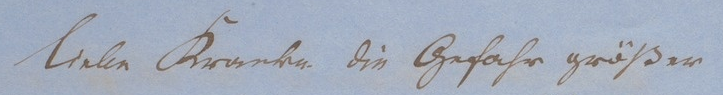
liebe Kranke die Gefahr größer
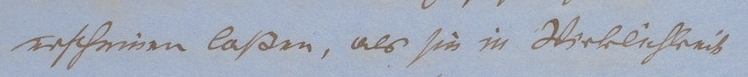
erscheinen laßen, als sie in Wirklichkeit
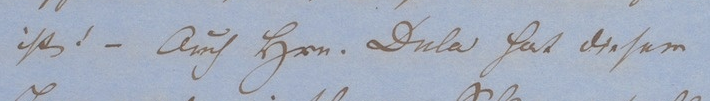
ist! – Auch Hrn. Dula hat dieser
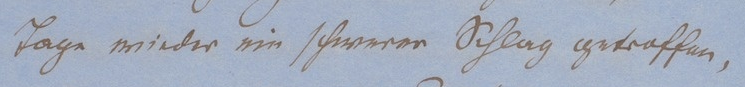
Tage wieder ein schwerer Schlag getroffen,
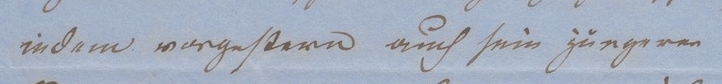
indem vorgestern auch sein jüngerer
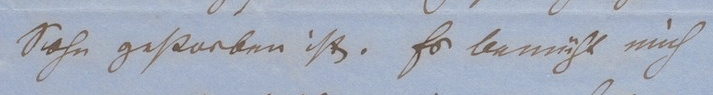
Sohn gestorben ist. Es bemüht mich
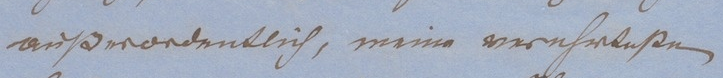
außerordentlich, meine verehrtesten
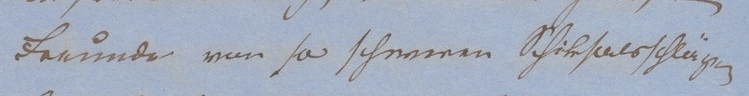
Freunde von so schwerern Schiksalsschlägen
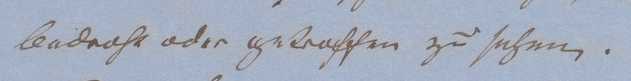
bedacht oder getroffen zu sehen.
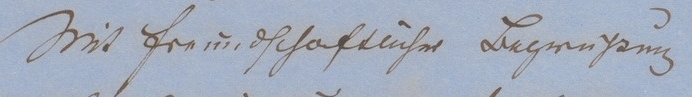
Mit freundschaftlicher Begrüßung
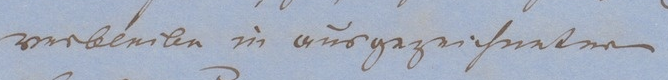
verbleibe in ausgezeichneter
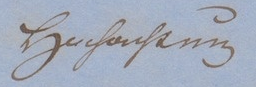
Hochachtung
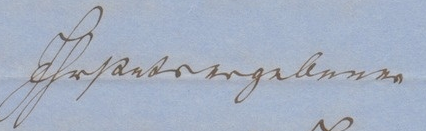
Ihr stets ergebener
